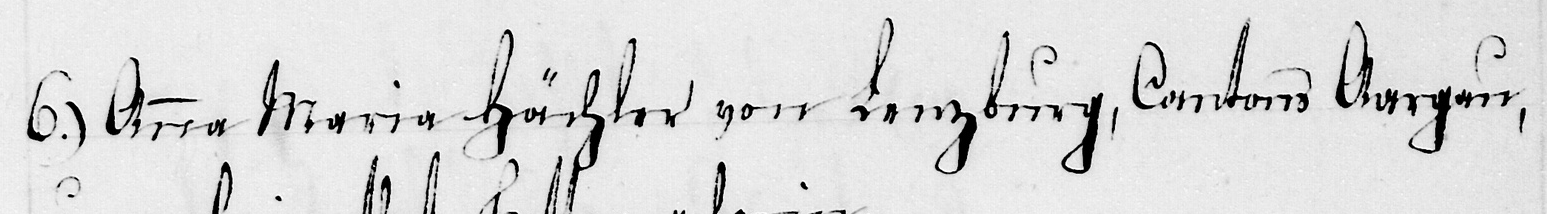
6.) Anna Maria Hächler von Lenzburg, Cantons Aargau,
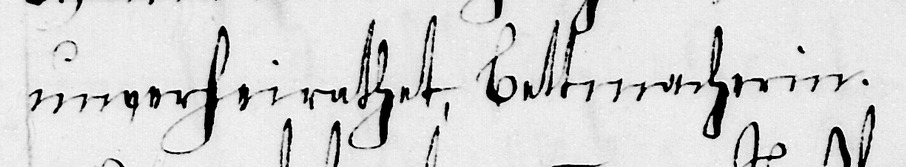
unverheirathet, Bettmacherin.
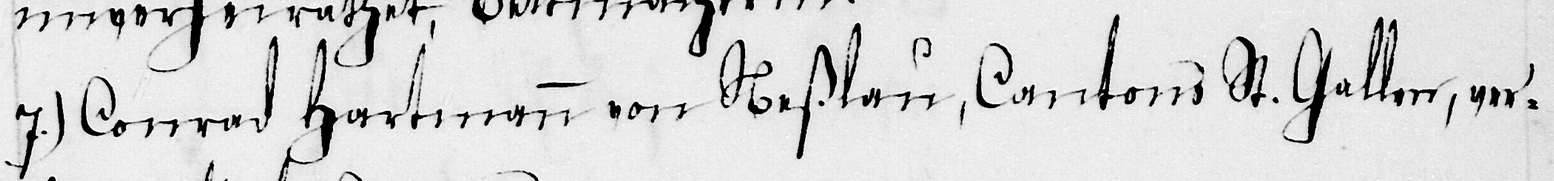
7.) Conrad Hartmann von Neßlau, Cantons St. Gallen, ver¬
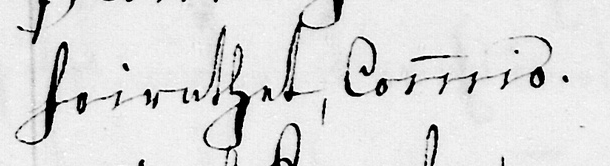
heirathet, Commis.
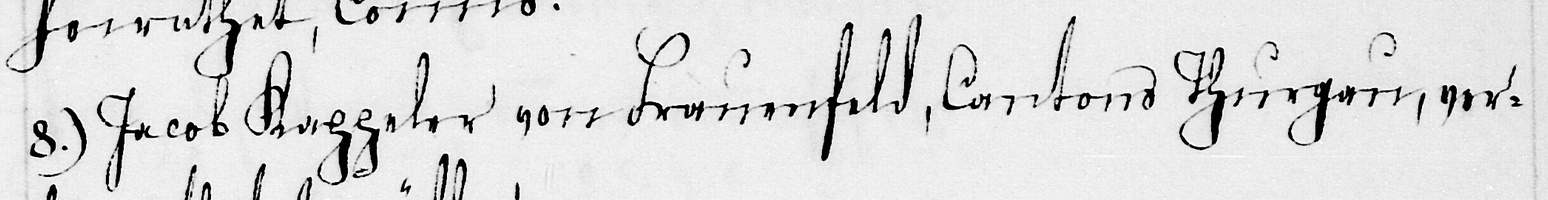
8.) Jacob Kappeler von Frauenfeld, Cantons Thurgau, ver¬
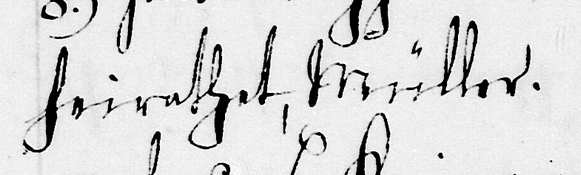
heirathet, Müller.
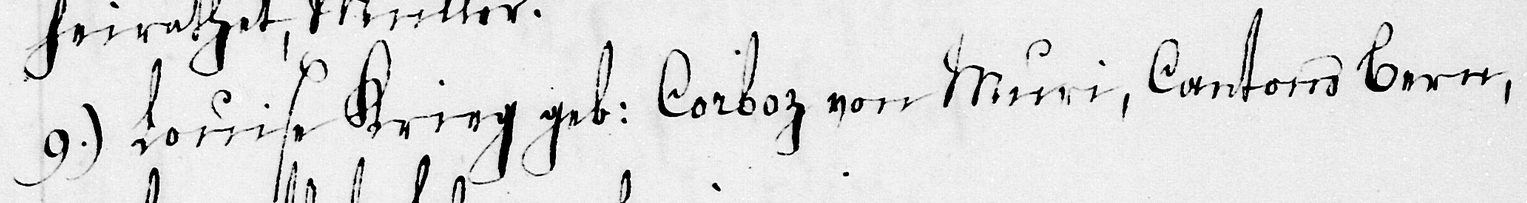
9.) Louise Krieg geb. Corboz von Muri, Cantons Bern,
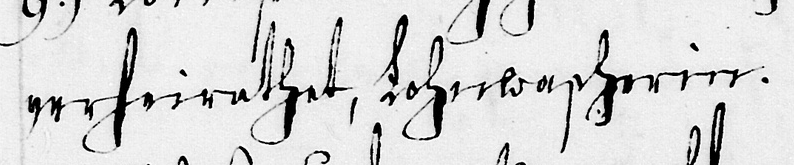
verheirathet, Lohnwascherin.
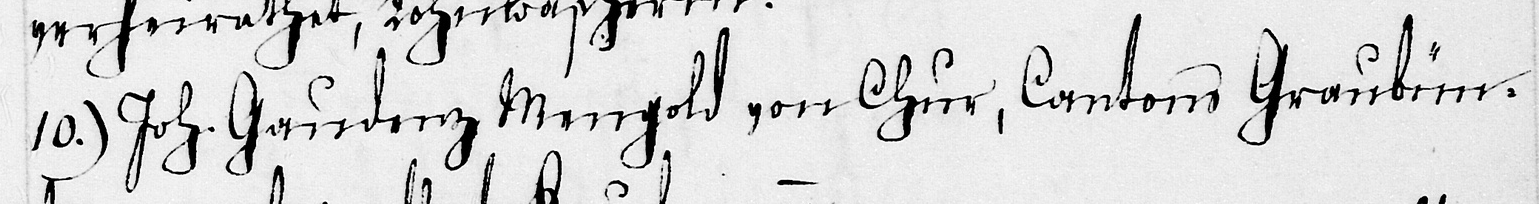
10.) Joh. Gaudenz Mengold von Chur, Cantons Graubün¬
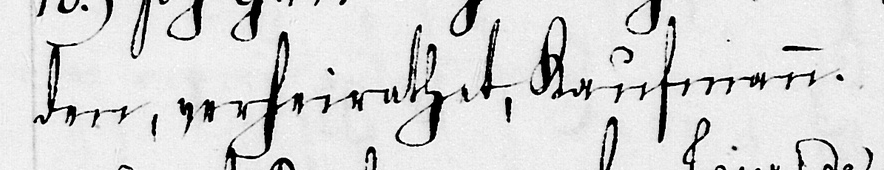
den, verheirathet, Kaufmann.
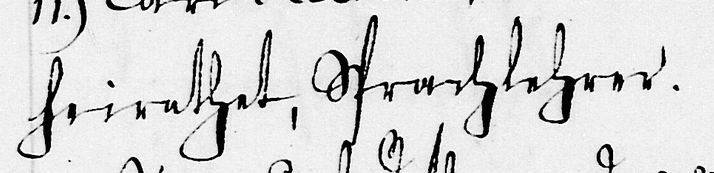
heirathet, Sprachlehrer.
